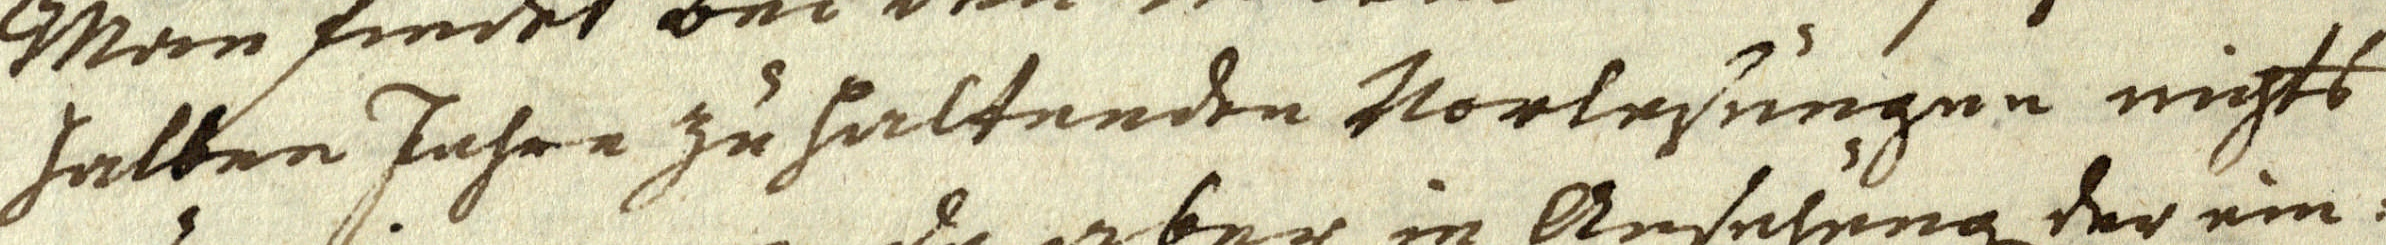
halben Jahre zur haltenden Vorlesungen nichts
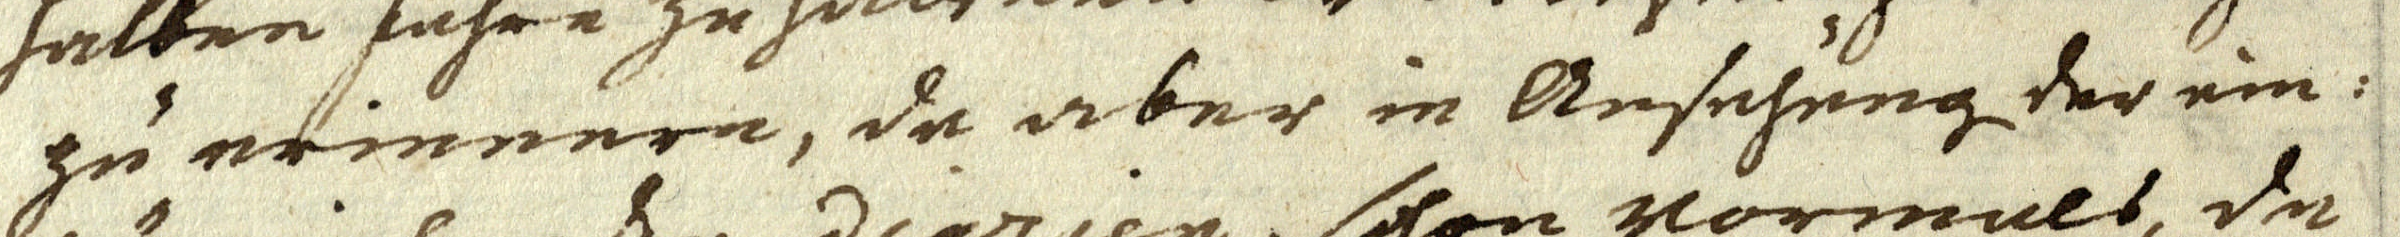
zu erinnern, da aber in Ansehung der ein¬
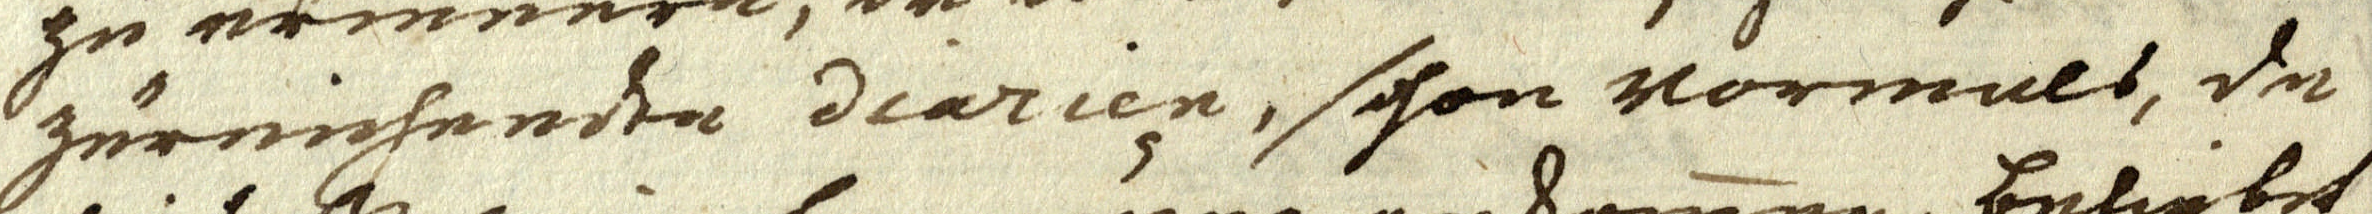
zureichenden diarien, schon vormals, da
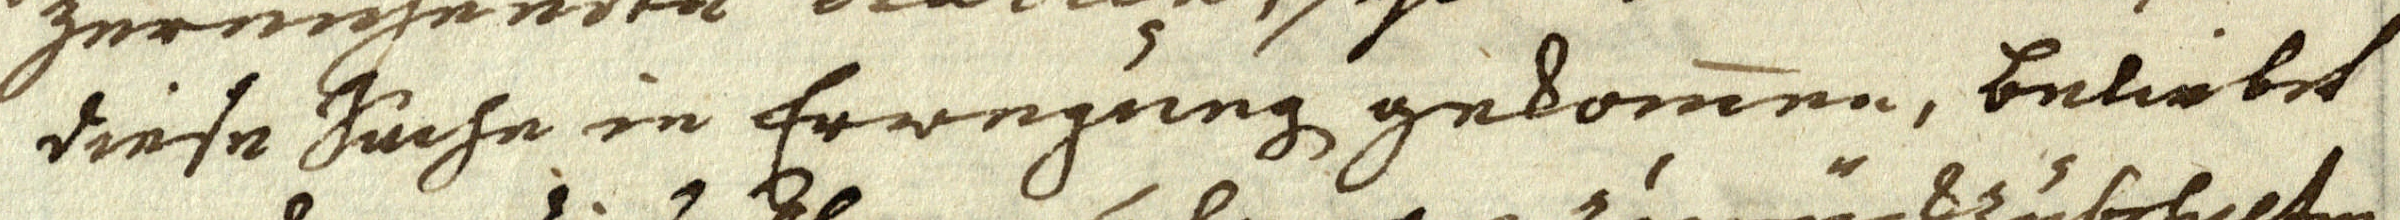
diese Sache in Erwegung, gekomen, beliebet
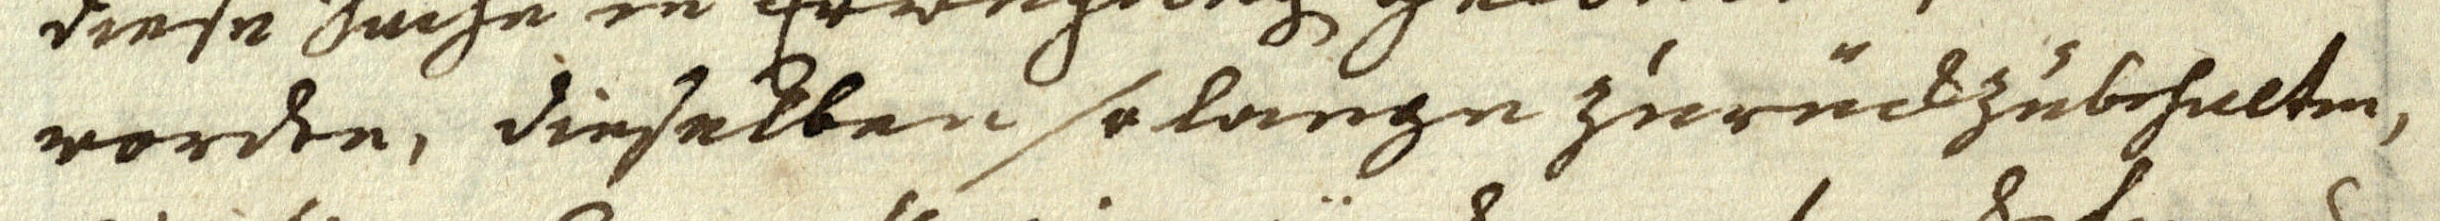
worden, dieselben Er lange zurückzubehalten,
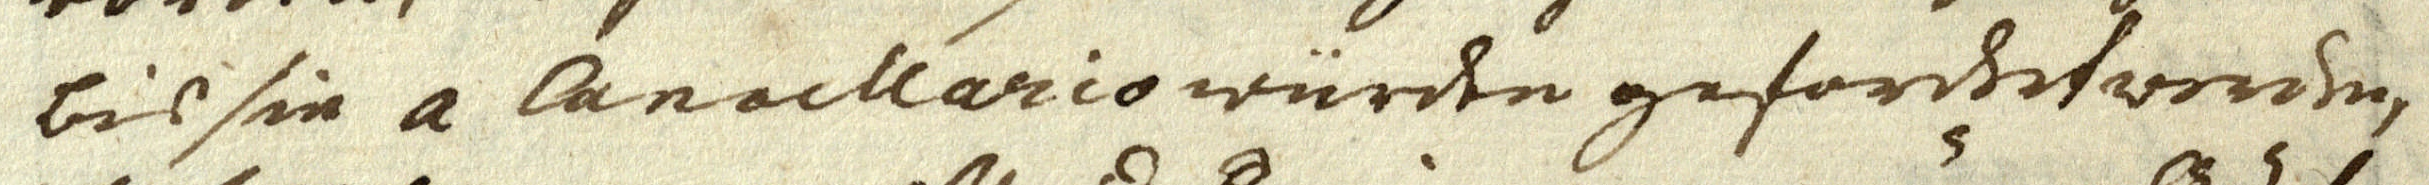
bis sie a Cancellario würden gefordert werden,
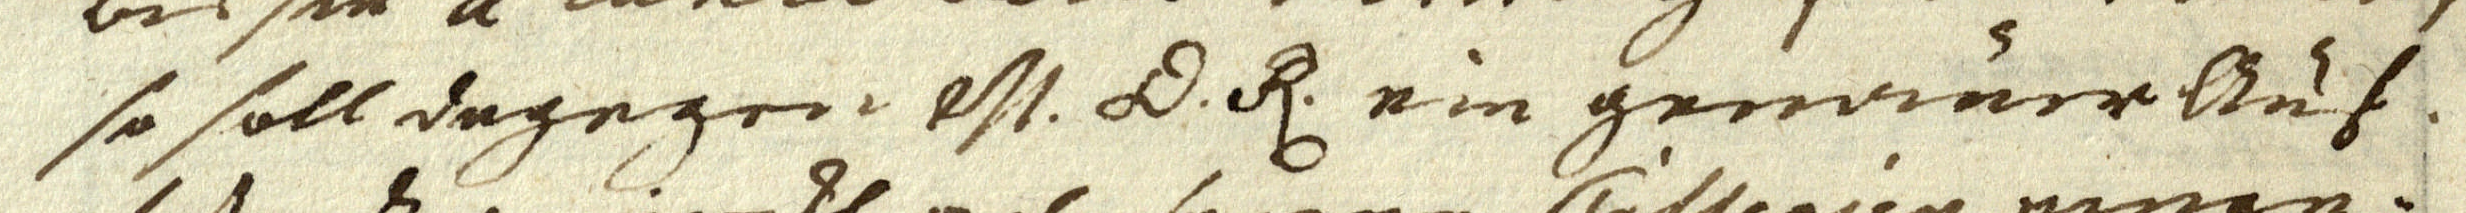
so soll dagegen. M. D. R. ein genauer Auf¬
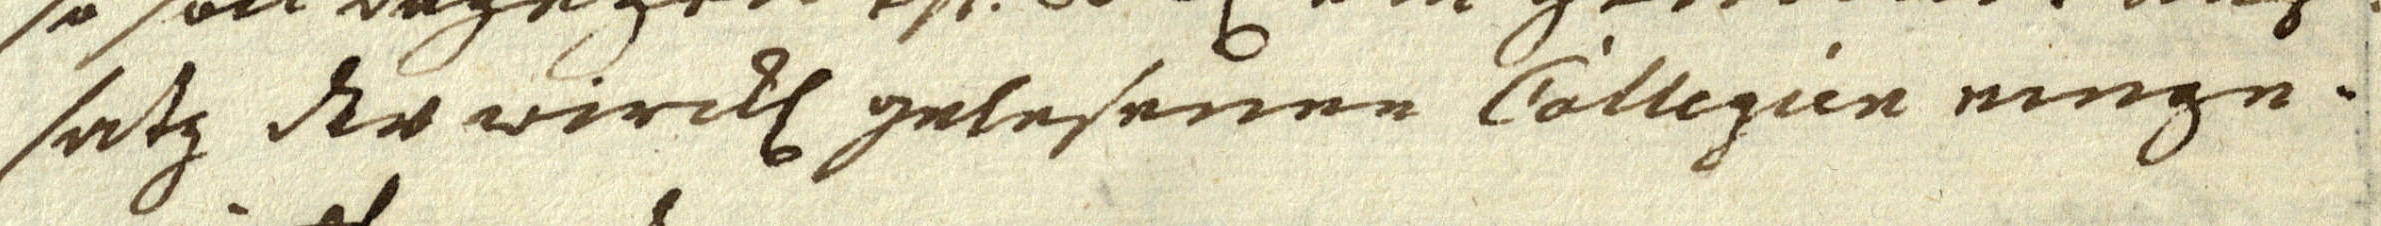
satz der wirckl gelesenen Collegien einge¬
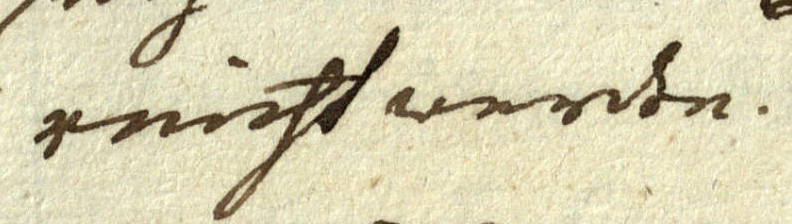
reicht werden.
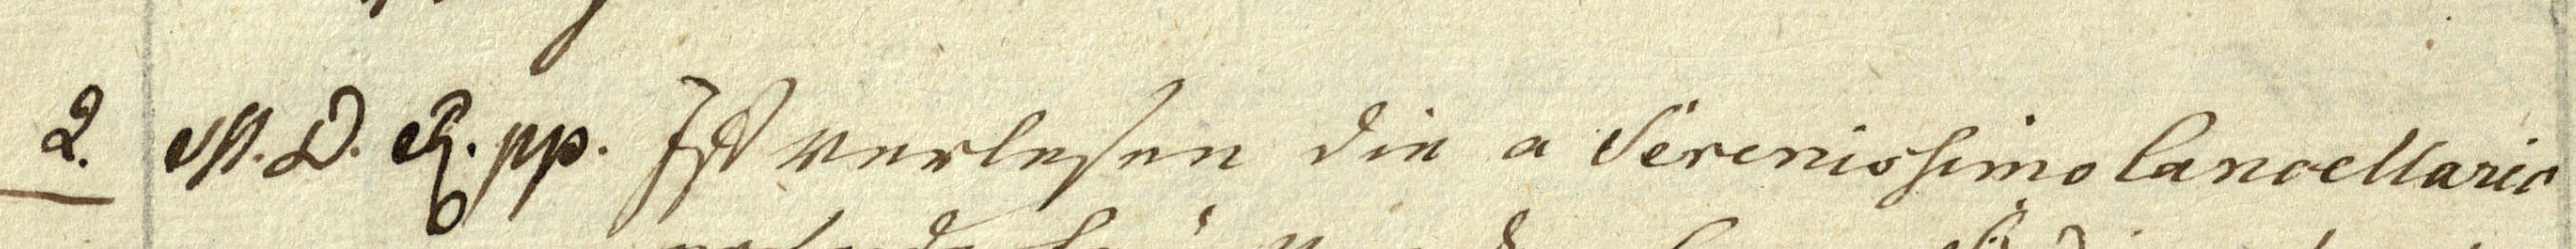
2. M. D. R. pp. Ist verlesen die a Serenissimo Cancellario
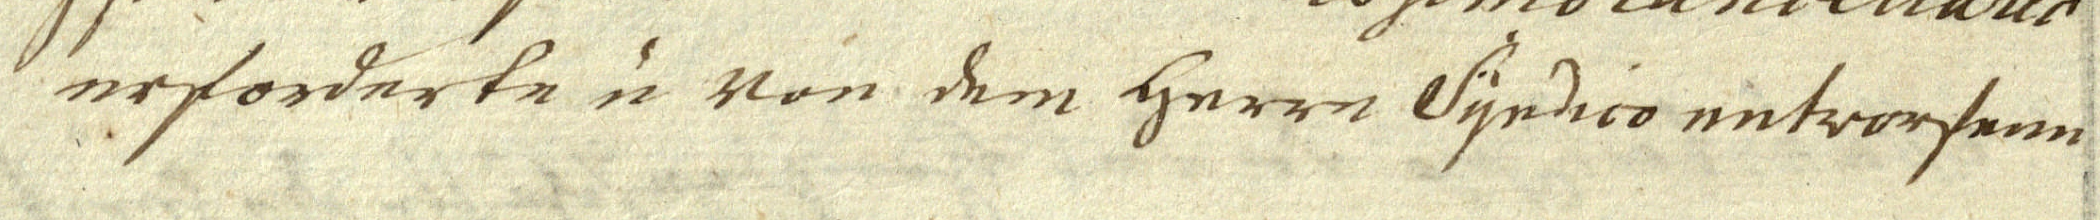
erforderte u von dem Herrn Sÿndico entworfene
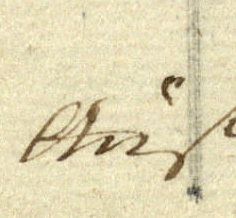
Auß
